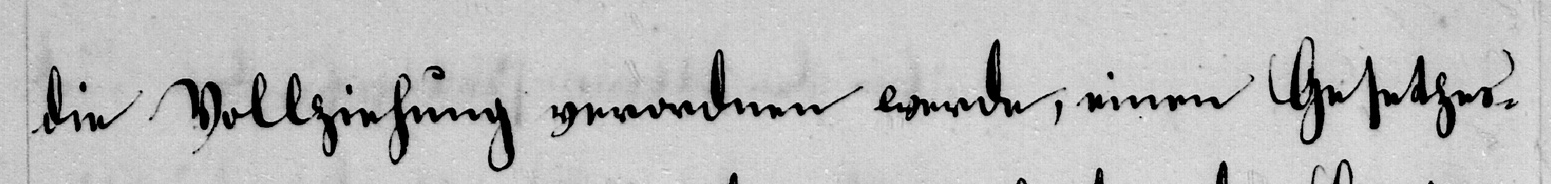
die Vollziehung verordnen werde, einen Gesetzes¬
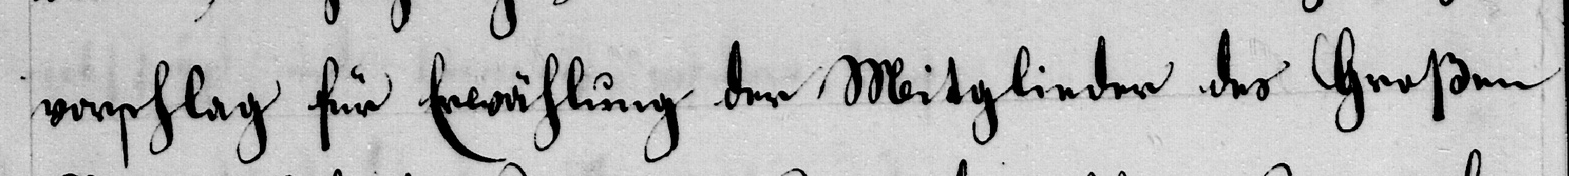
vorschlag für Erwählung der Mitglieder des Großen
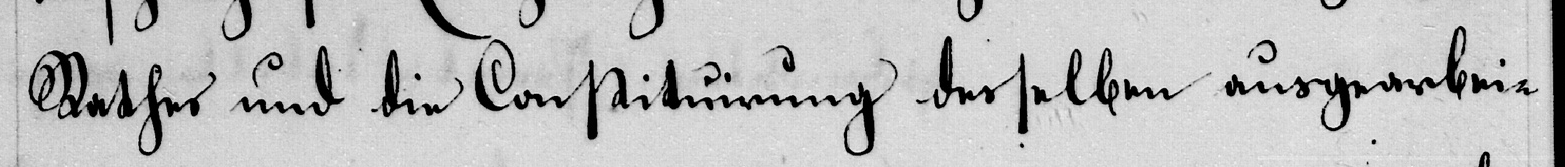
Rathes und die Constituirung desselben ausgearbei¬
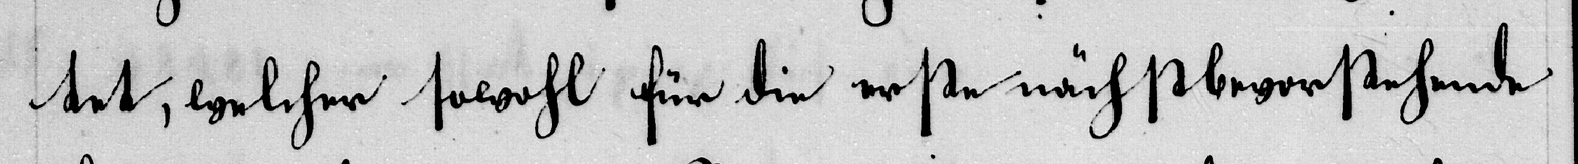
tet, welcher sowohl für die erste nächstbevorstehende
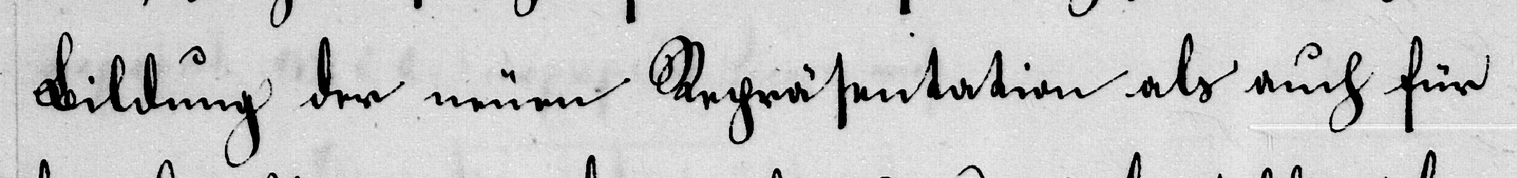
Bildung der neuen Repräsentation als auch für
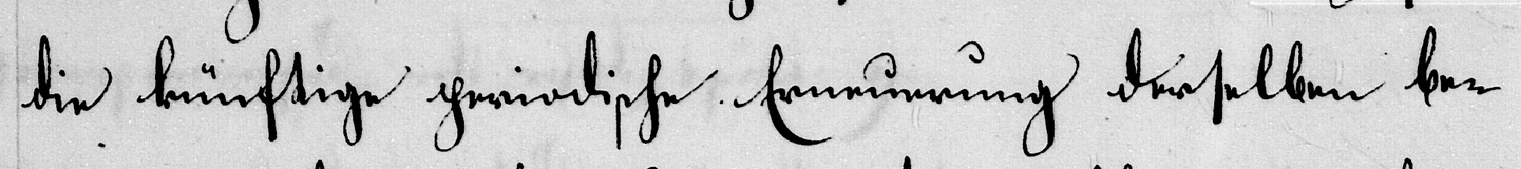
die künftige periodische Erneuerung derselben be¬
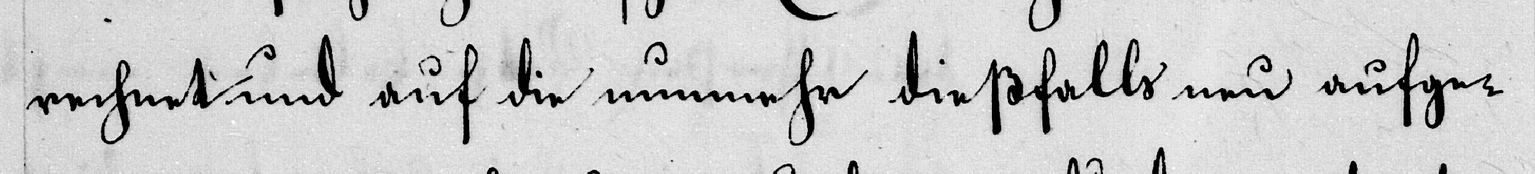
rechnet und auf die nunmehr dießfalls neu aufge¬
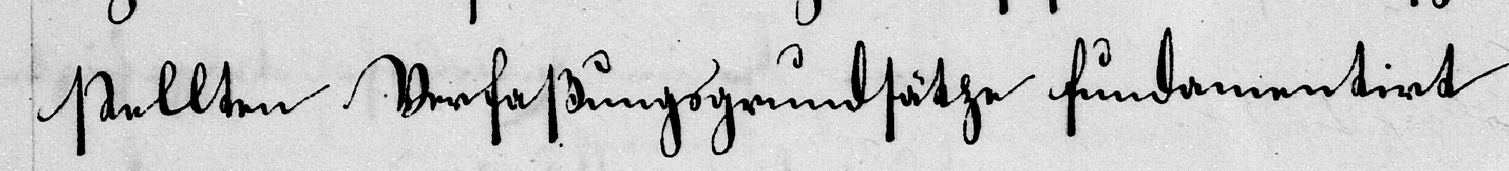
stellten Verfaßungsgrundsätze fundamentirt
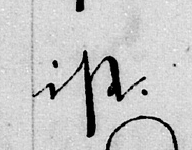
ist.
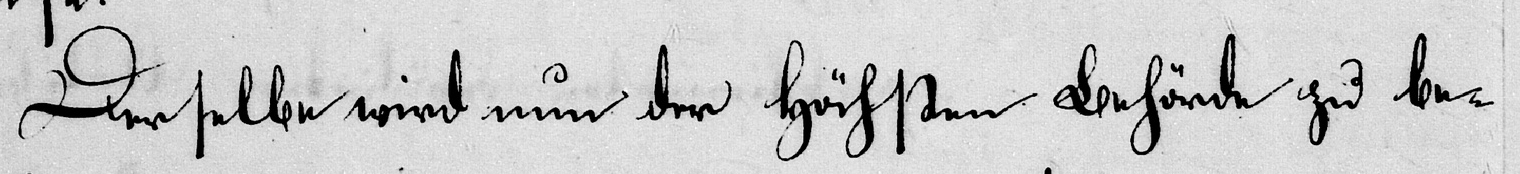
Derselbe wird nun der Höchsten Behörde zu be¬
